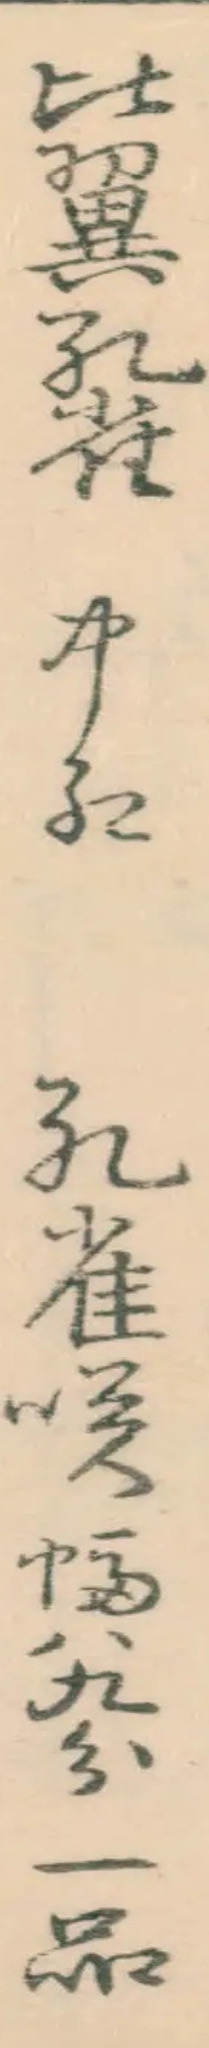比翼孔雀中紅孔雀咲幅ハ九分一品
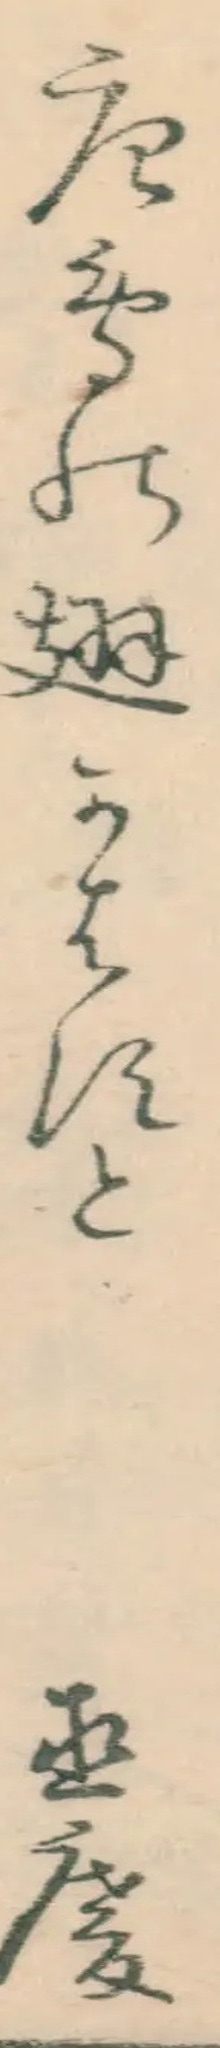唐鳥の翅かはすと直慶
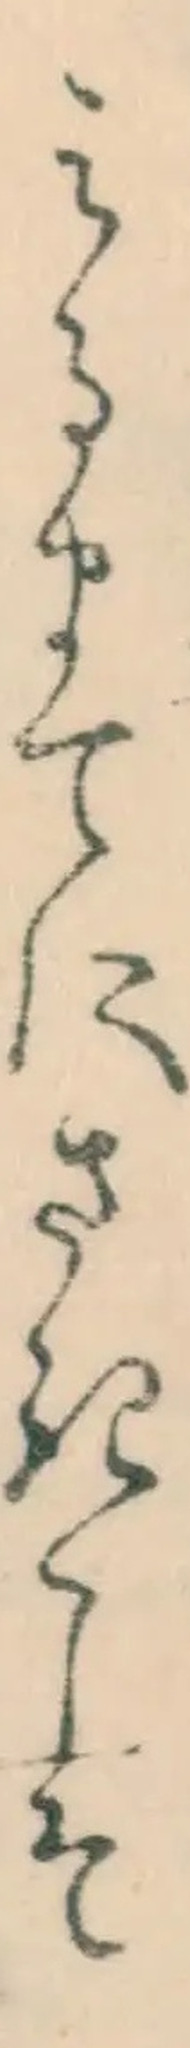のるまてにさきてそ
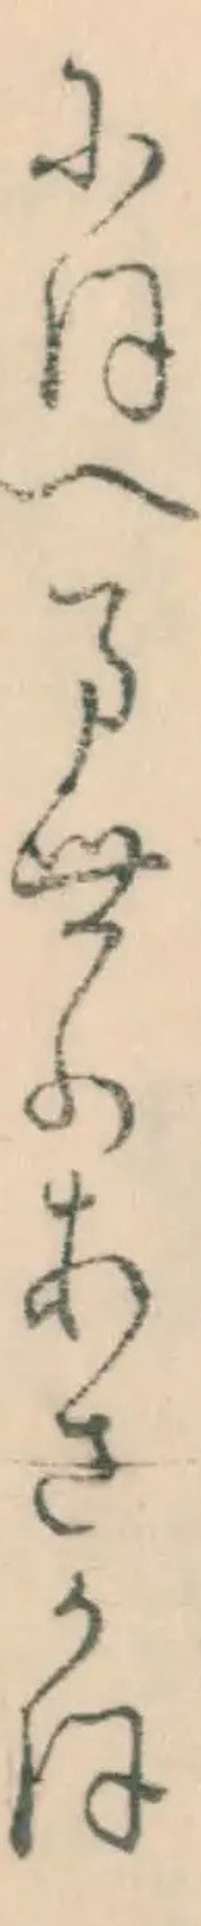にほへしなのあさかほ
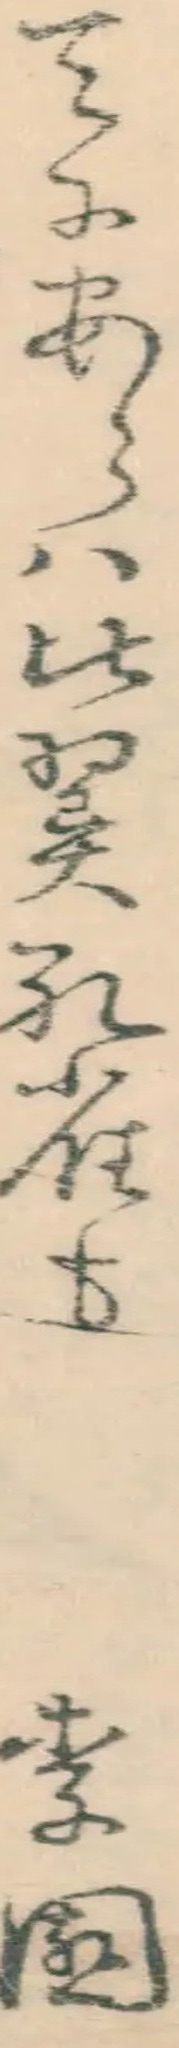天にあらハ比翼孔雀も李園
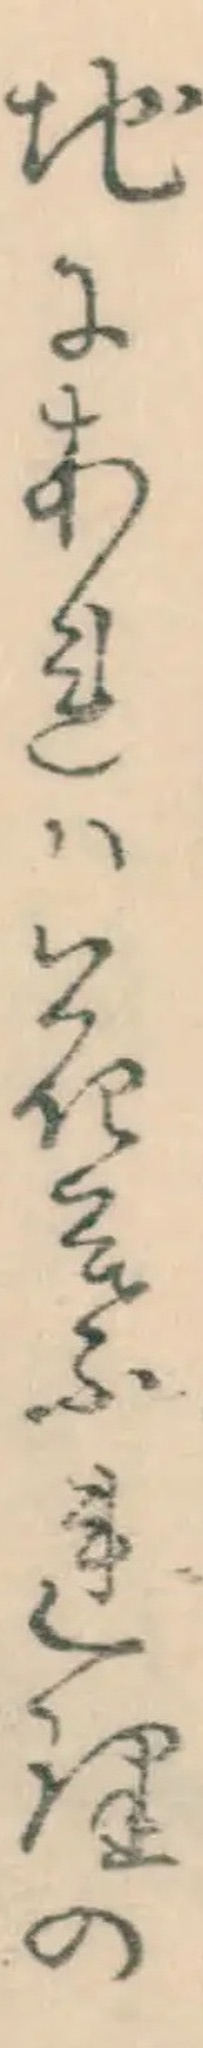地にあれハ花葉連理の
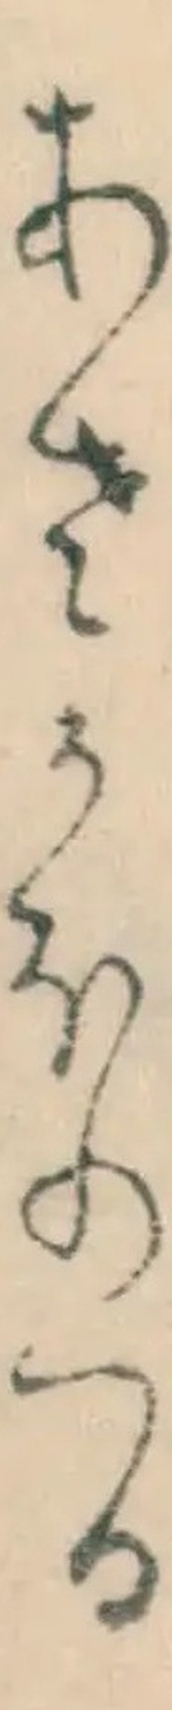あさかほのつる

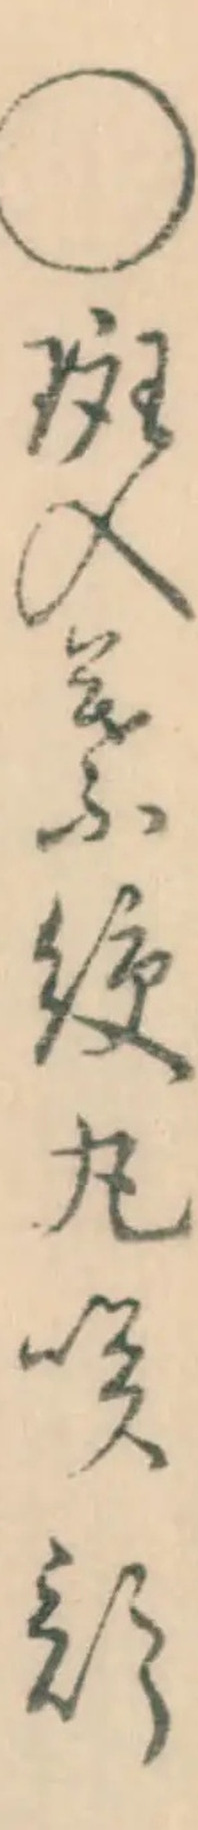〇斑入葉綾丸咲部
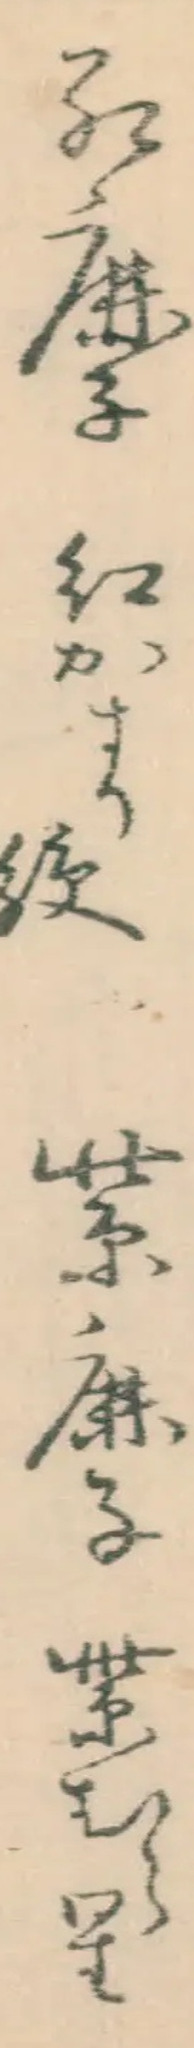紅鹿子紅かすり綾紫鹿子紫むら星
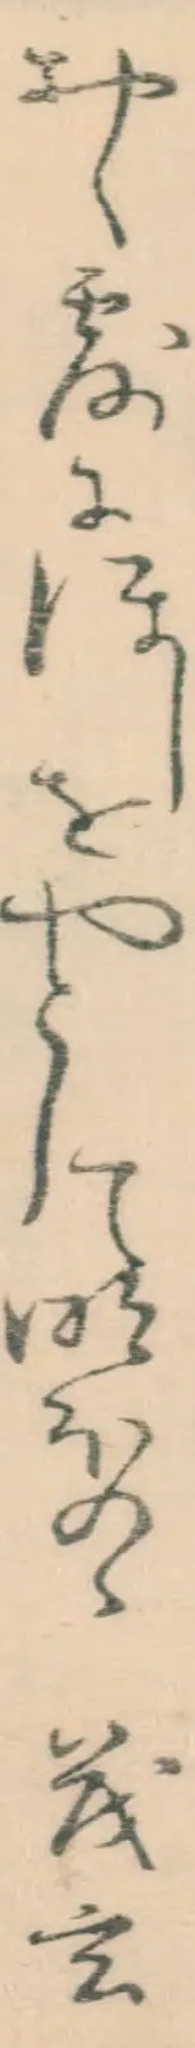おく霜にほしをやとして明ほのゝ
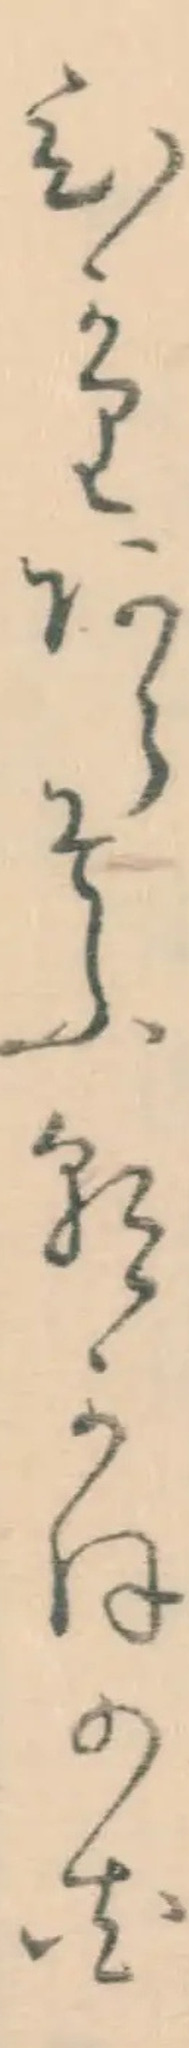ひかりあらそふ朝かほの花
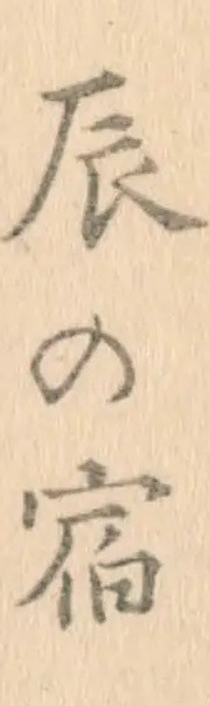辰の宿

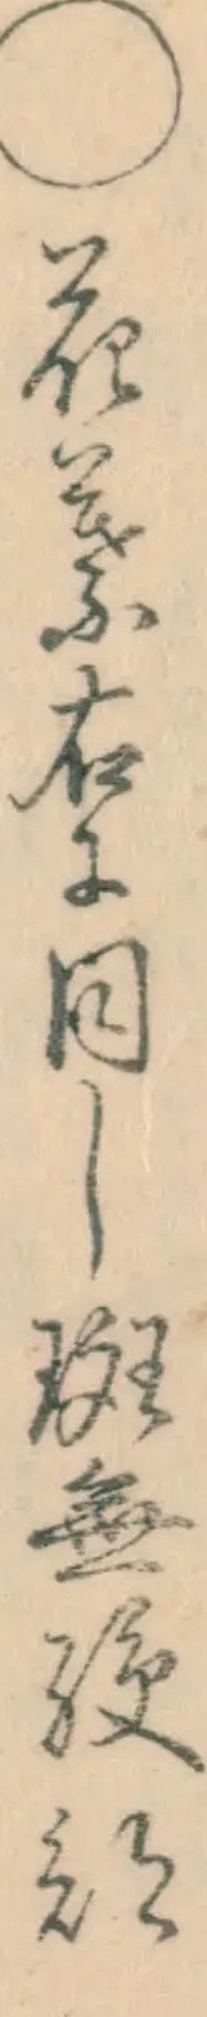○花葉右に同し班無綾部

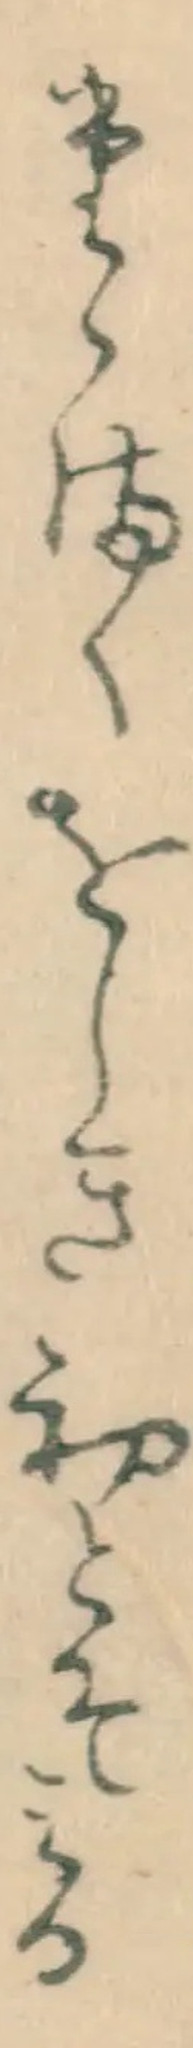ふまくをしき初とそミる
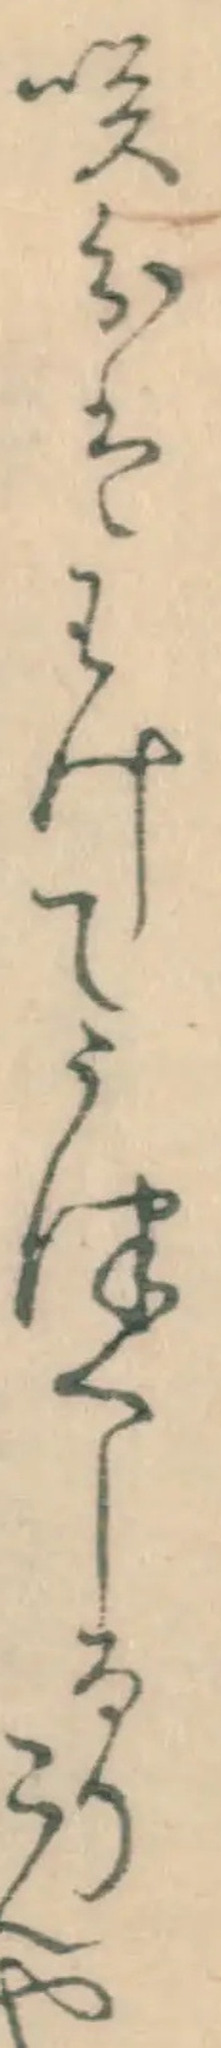咲分はわけてうつくしるりこんや蟹丸
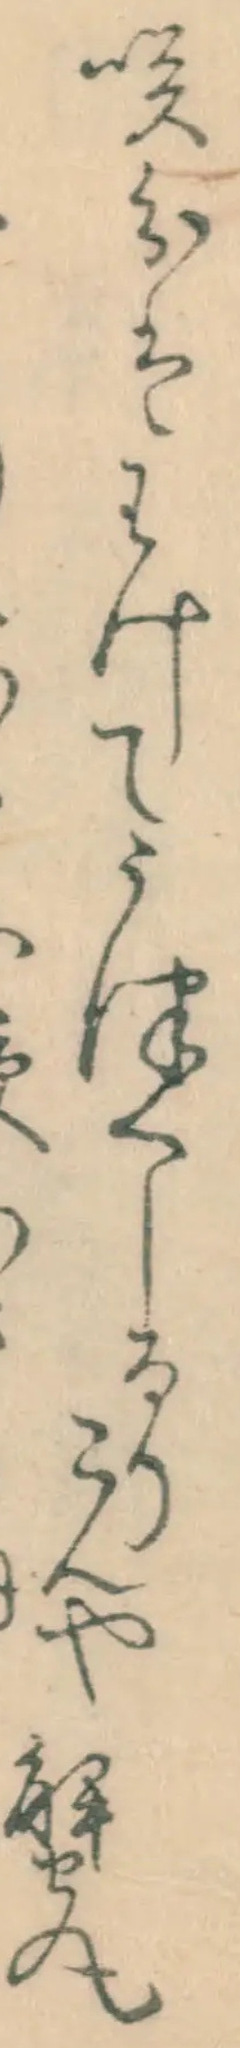咲分はわけてうつくしるりこんや蟹丸
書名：花壇朝顔通 2巻. [2]
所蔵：国立国会図書館 National Diet Library, JAPAN
